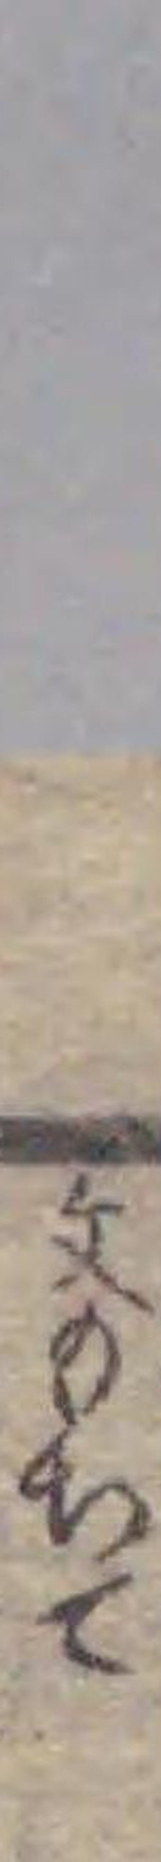文もちて
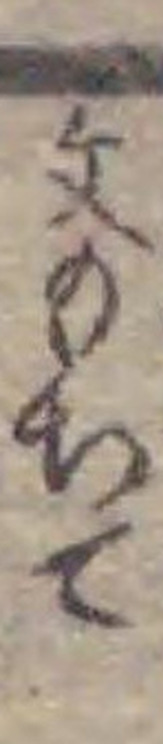文もちて
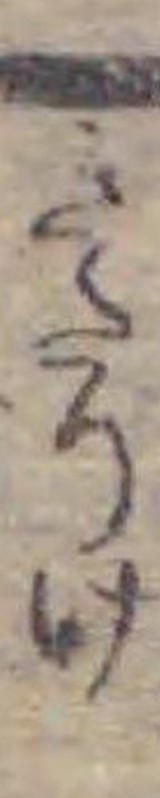きたりけ
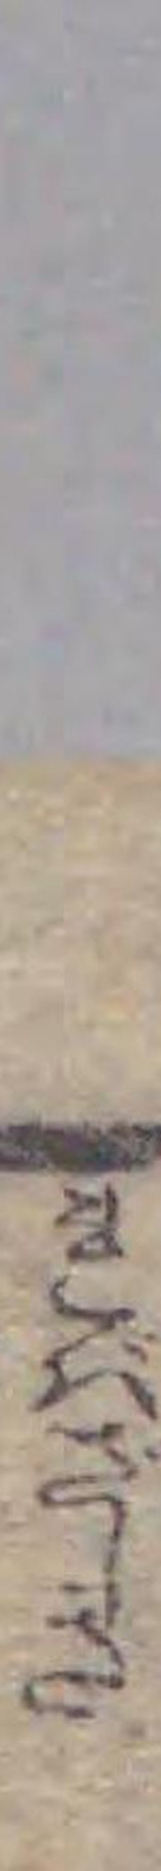ればざしき
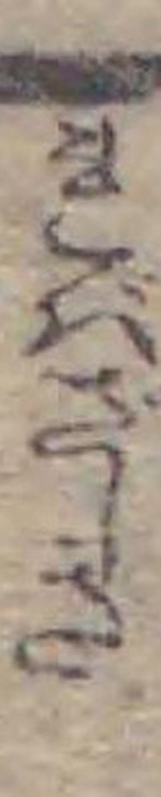ればざしき
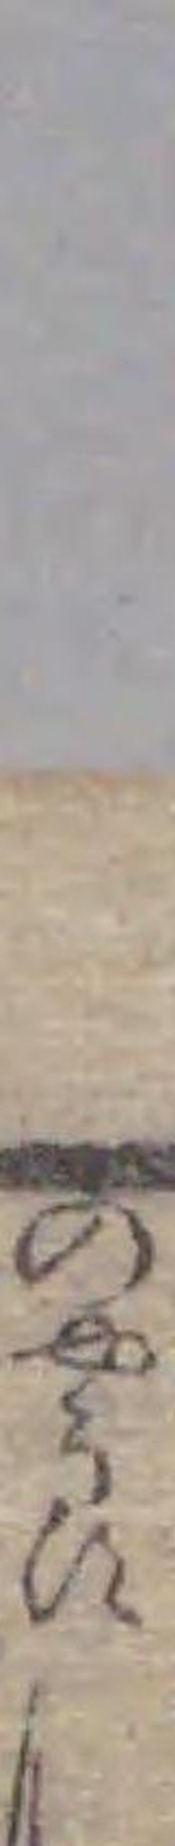のやうす
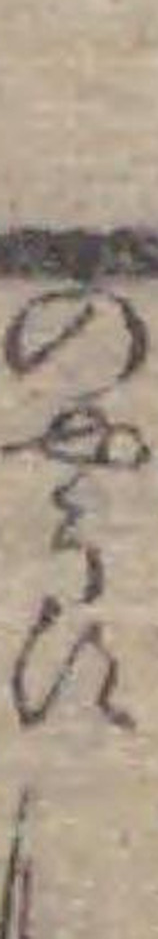のやうす
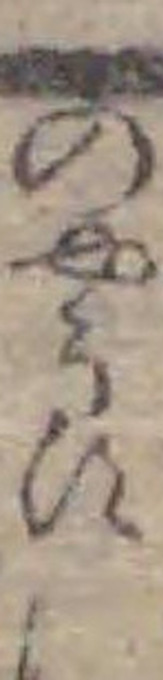のやうす
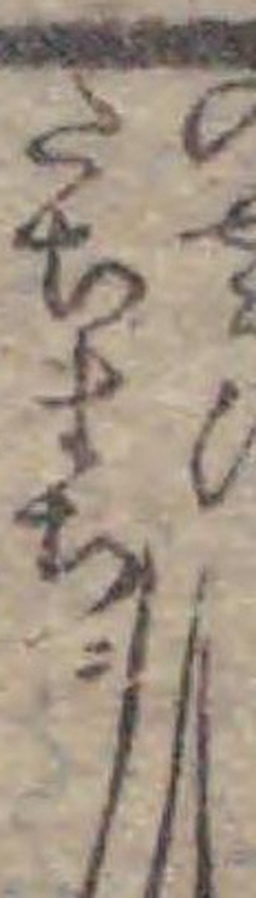たちまちに
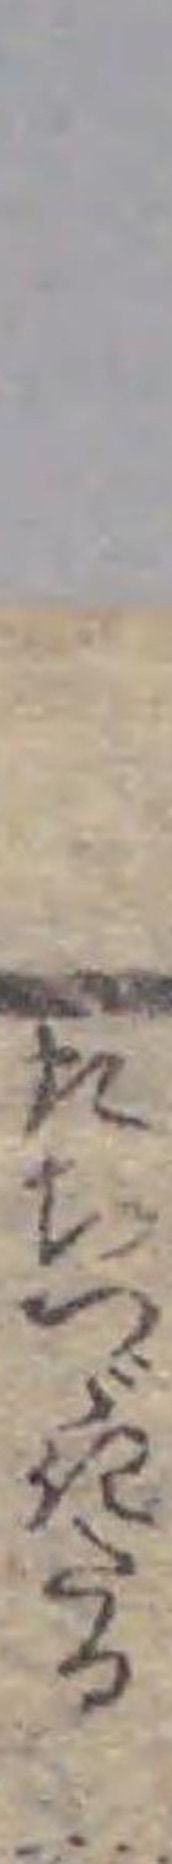打ちつゞきたる
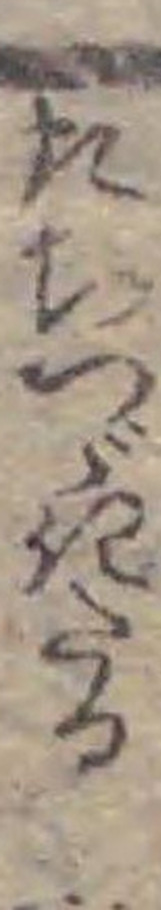打ちつゞきたる
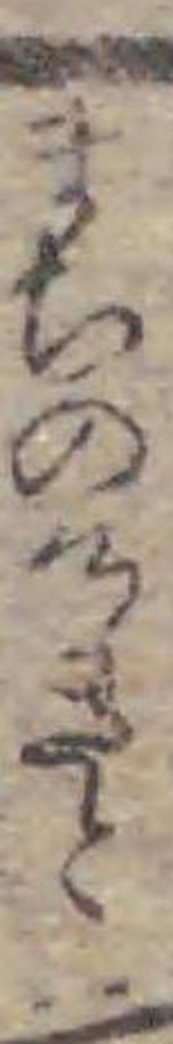まちのけしきと
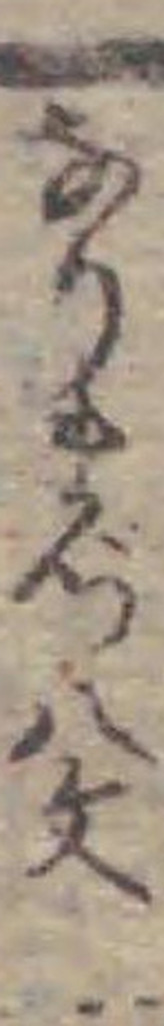なりまづ八文
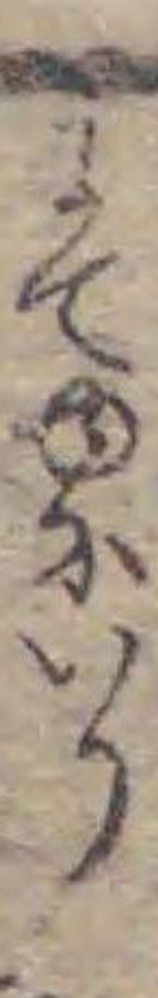にてゆにいり
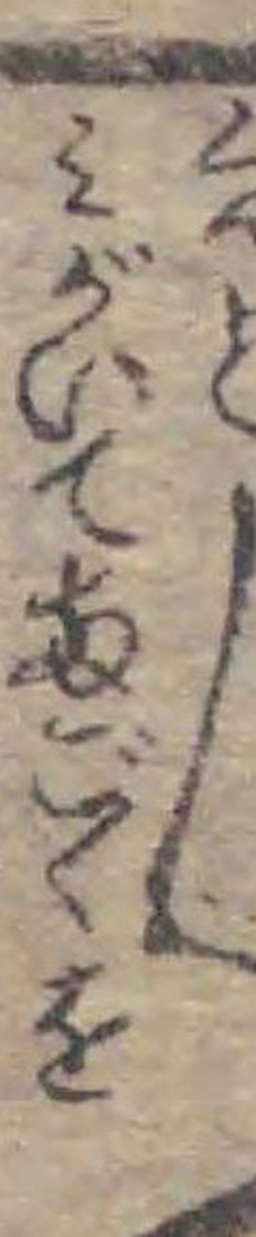みがいて両ごくを
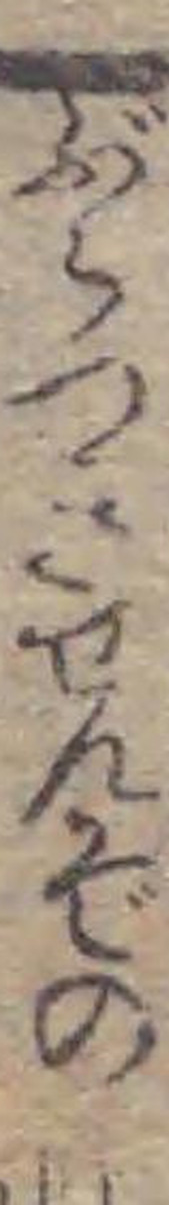ぶらつきせんぞの
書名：紺屋百物語 : 3巻
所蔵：国立国会図書館 National Diet Library, JAPAN
